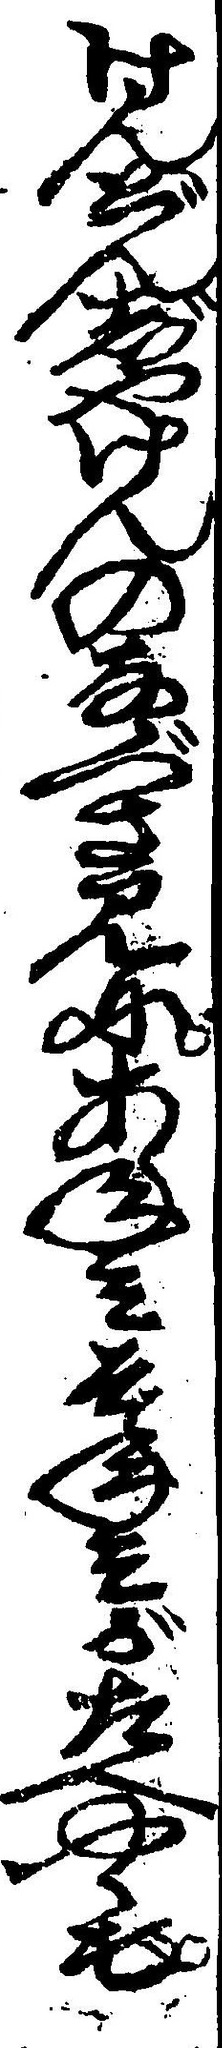けんどんじやけんのなぐさみに。あねみそねみがたへやらず。
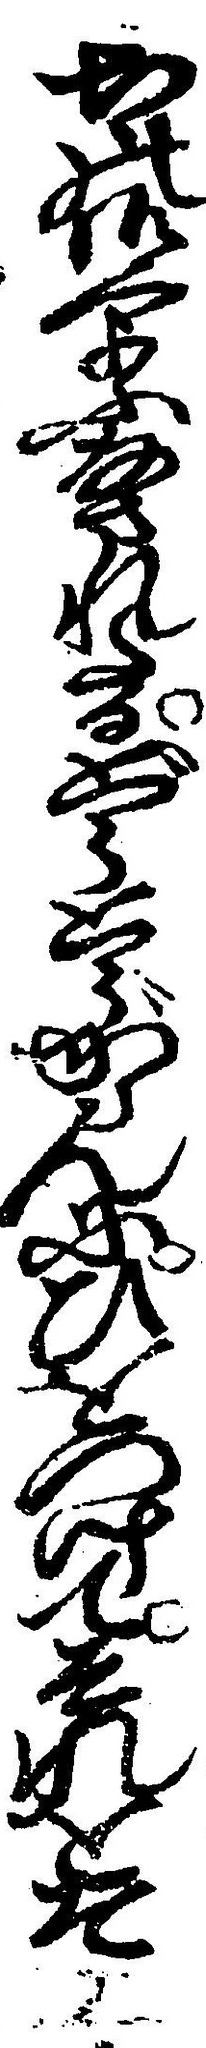ちゝの御くよふなされたる。どうとうとうがらんに。ひをつけて。それをそ
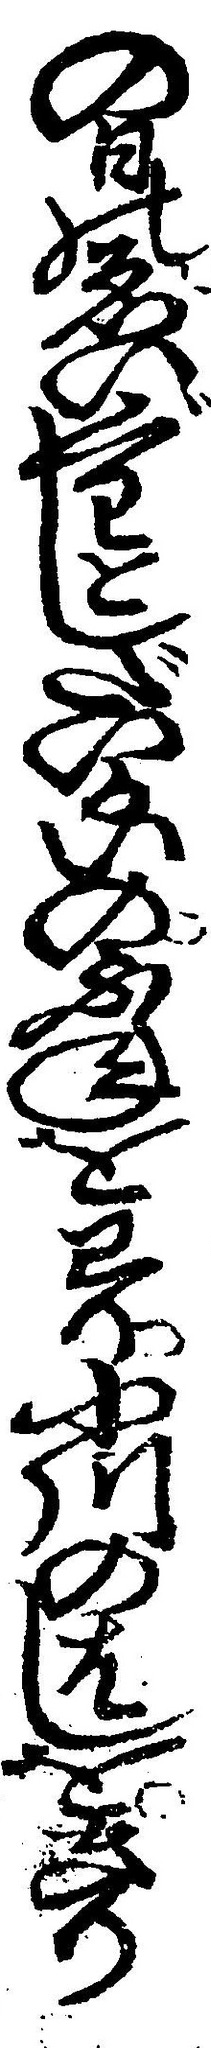の日の。ゑいぐわとしだいかいの。ふねをわり。小川のはしを。きり
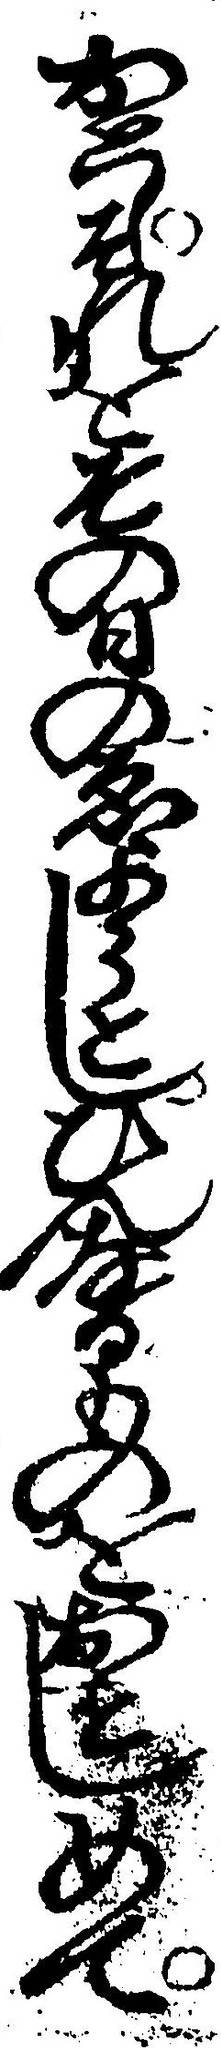おとし。それをその日のゑようとし。ひんなるものをおとしめて。
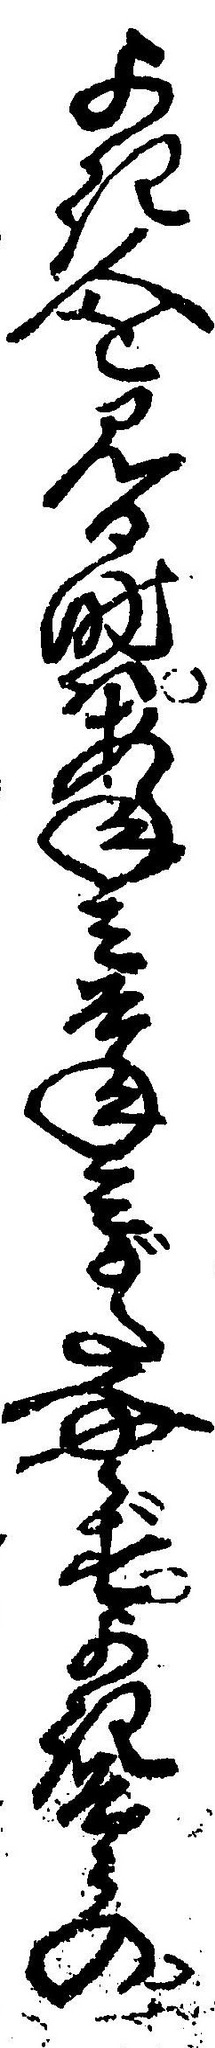よき人を見る時は。あてみそねみがたへやらず。よきそうの。
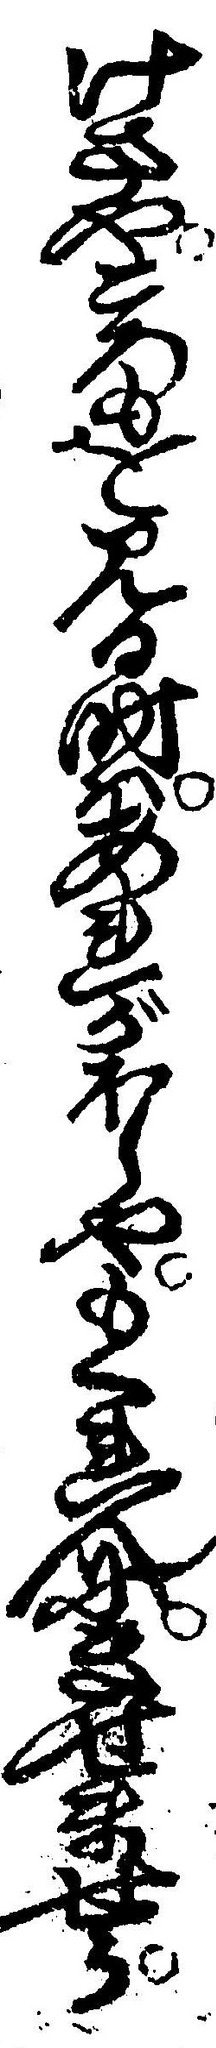けさや。ころもをみる時は。あれがほしや。もくれんに。きせませう。
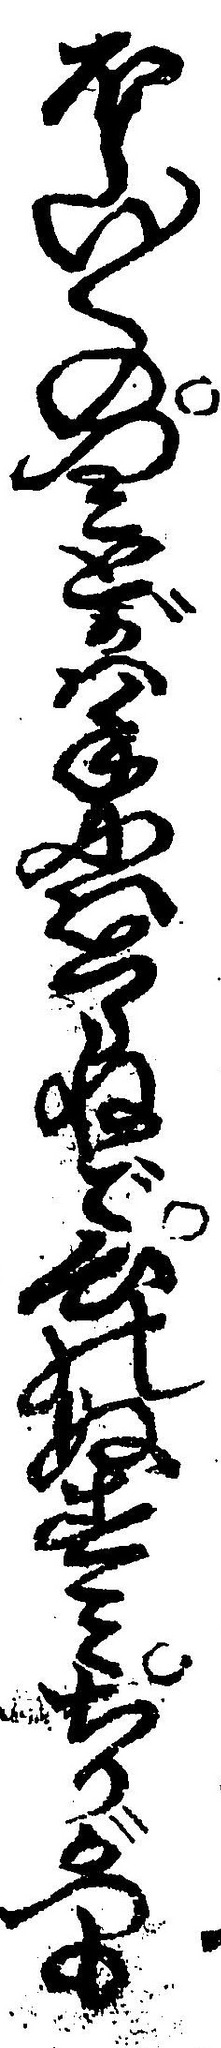ほしい〳〵の。つみとがは手にはとらねど。心のぬすみ。ちりがつも
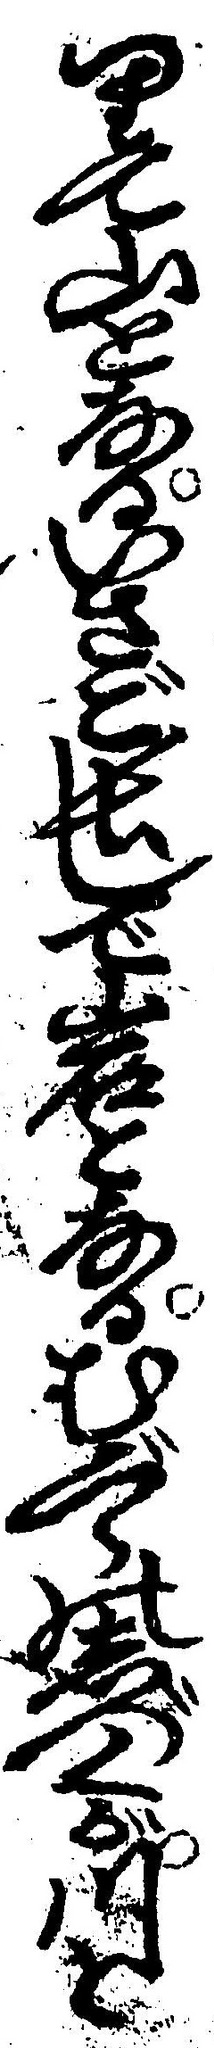りて山となる。いさご長しで岩となる。むぐらのしづくが。川と

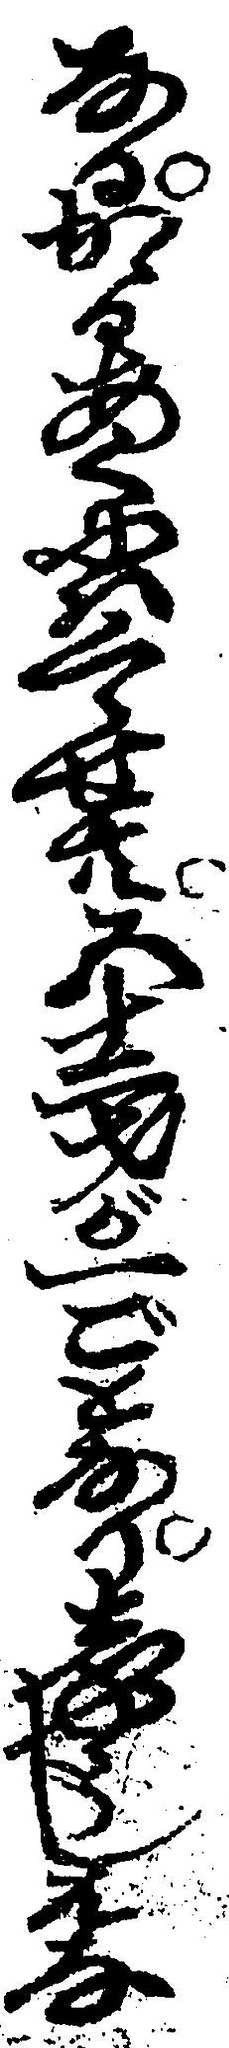なる。かゝるあくにはくらせ共。五十二才が一ごとなり。しやうじはな
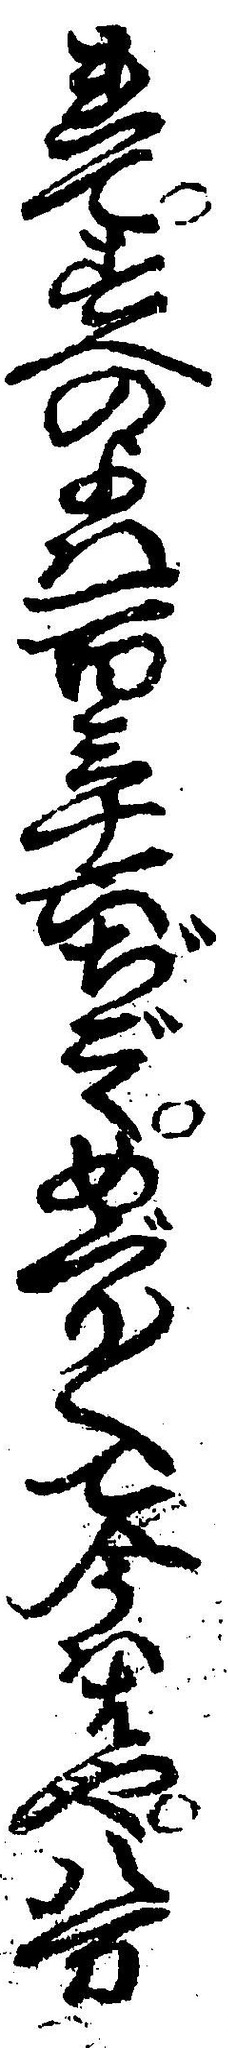れて。すへのよは一百三十六ぢごく。めぐり〳〵て今ははや。八万
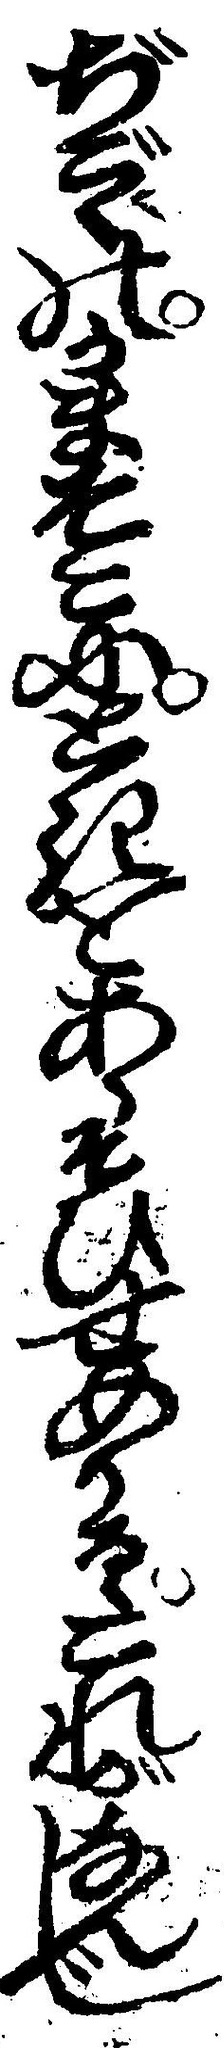ぢごくの。かまそこに。ときをあらそひせめりるゝ。これがなんじ
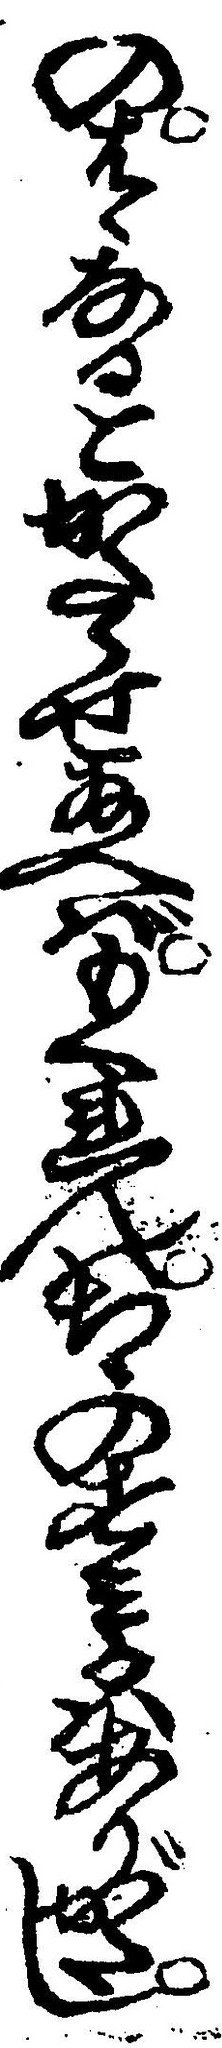の。はゝなるとかたらせ給へば。もくれんは。ちゝのすみかはありがたし。
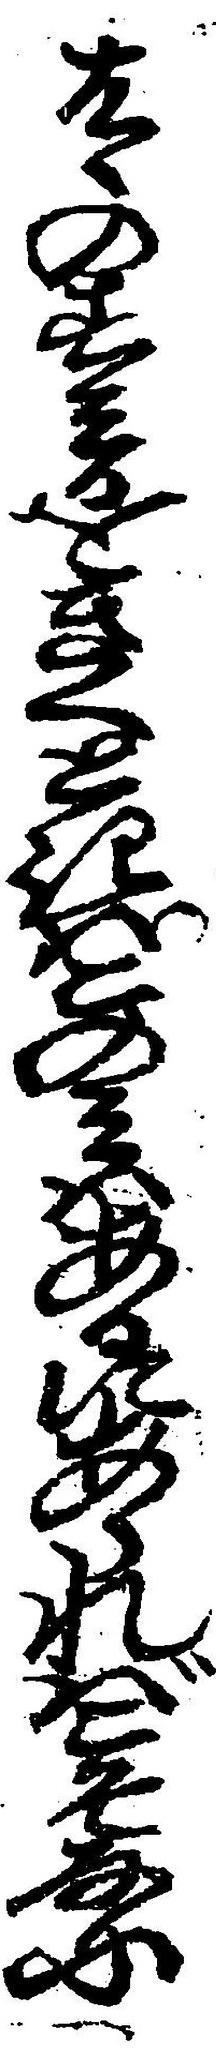はゝのすみかをきくときは。このみはあるにあらればこそなに
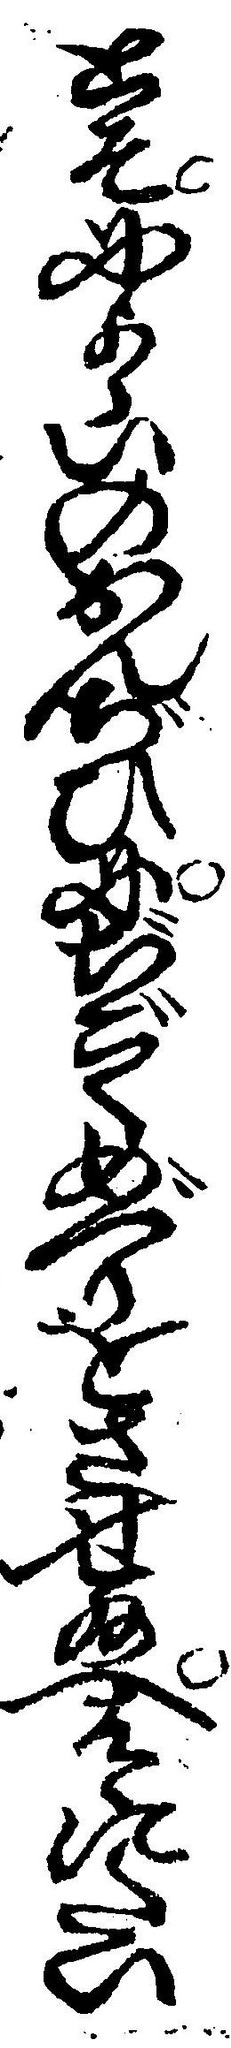とそ。によらいのおんぢひに。ぢごくめぐりをさせ給へ。はゝにたい
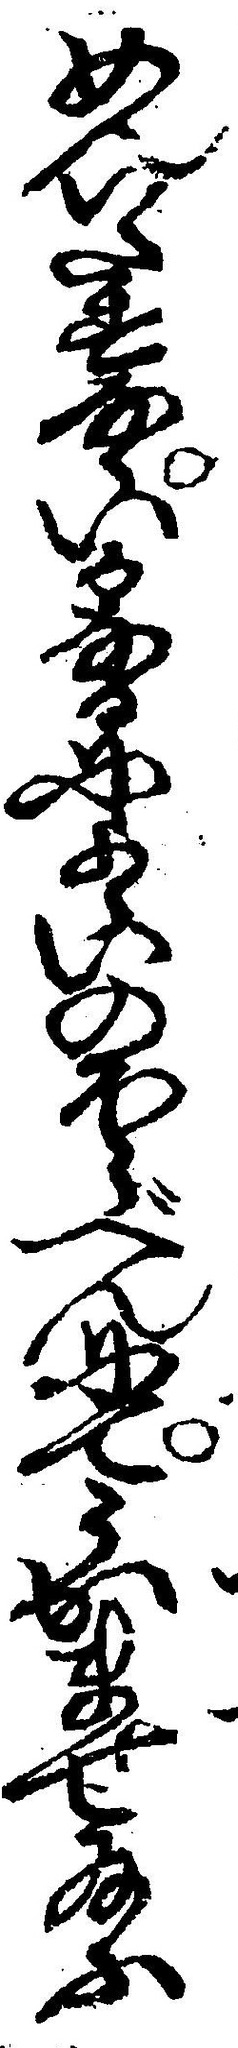めんいたすなら。いかなるによらいのほうべんにて。うかませ給ふ
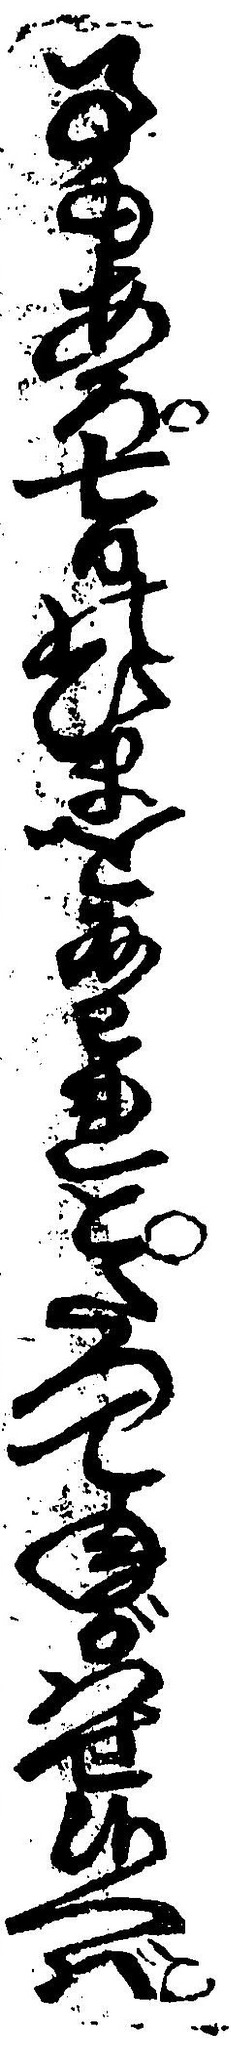事もあろ。七日ひまを給われと。たつてねがはせ候へば。
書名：目連尊者地獄めくり / 宇留藤太夫正本
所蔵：東京大学総合図書館 General Library in the University of Tokyo, JAPAN
